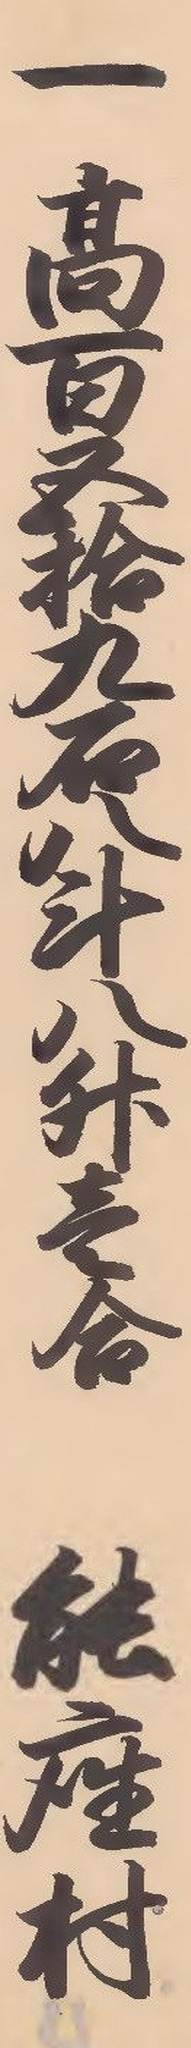一高百五拾九石八斗八升壱合能座村
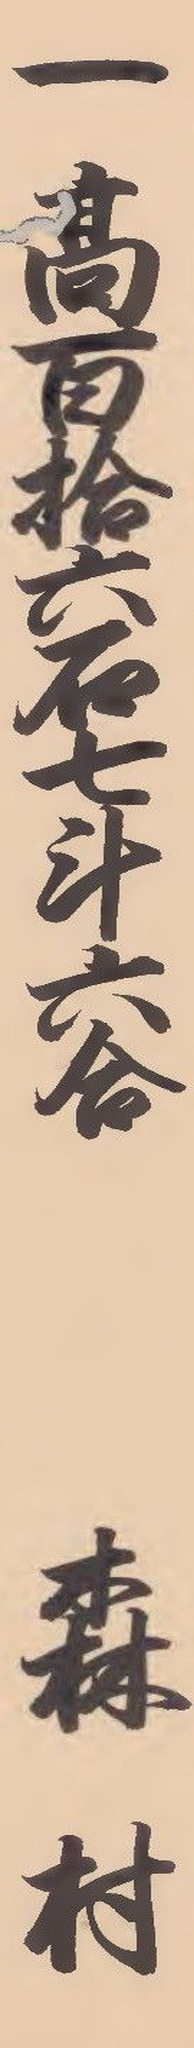一高百拾六石七斗六合森村
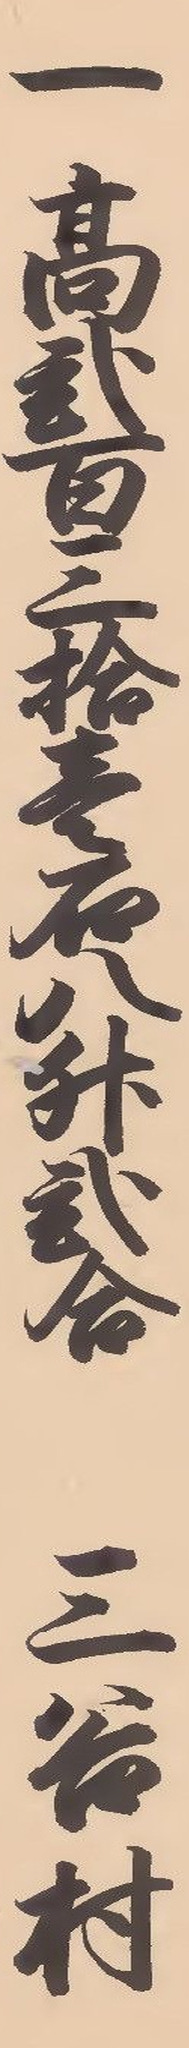一高弐百三拾壱石八升弐合三谷村

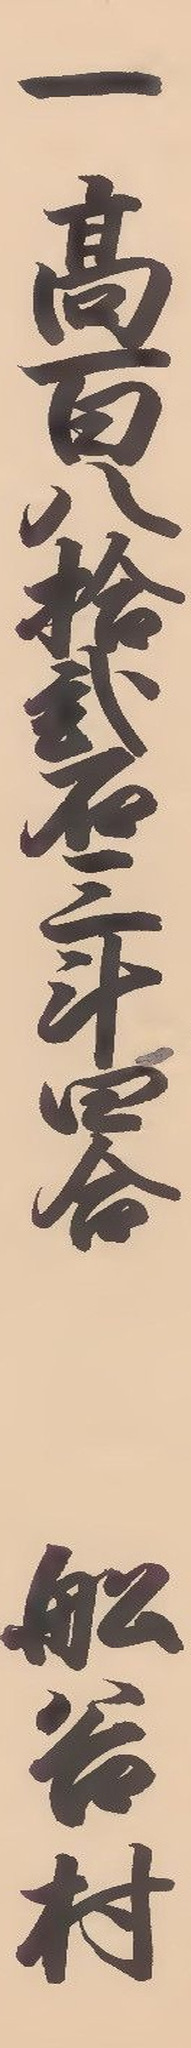一高百八拾弐石三斗四合船谷村
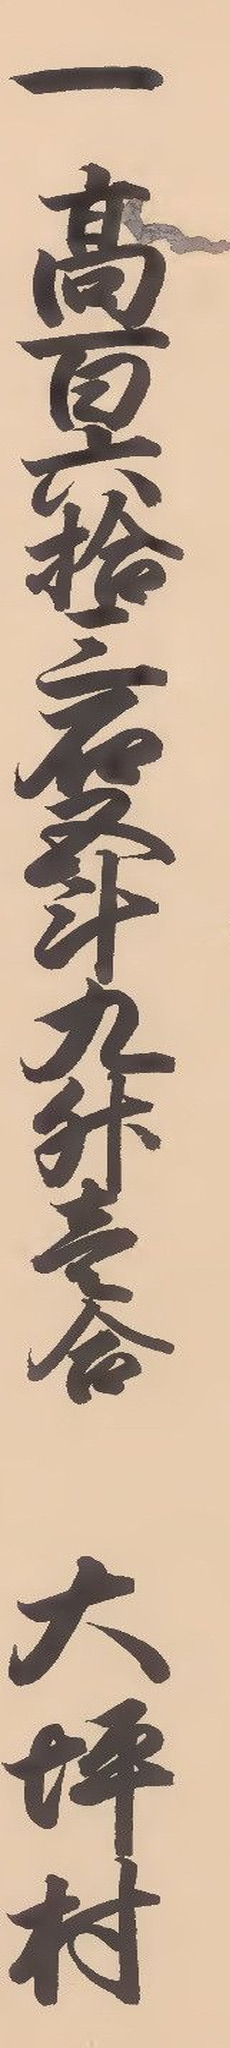一高百六拾三石五斗九升壱合大坪村
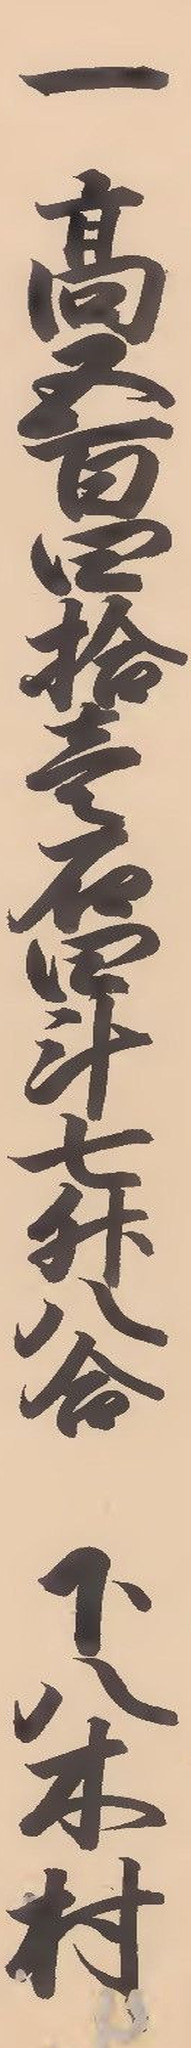一高五百四拾壱石四斗七八合下八木村
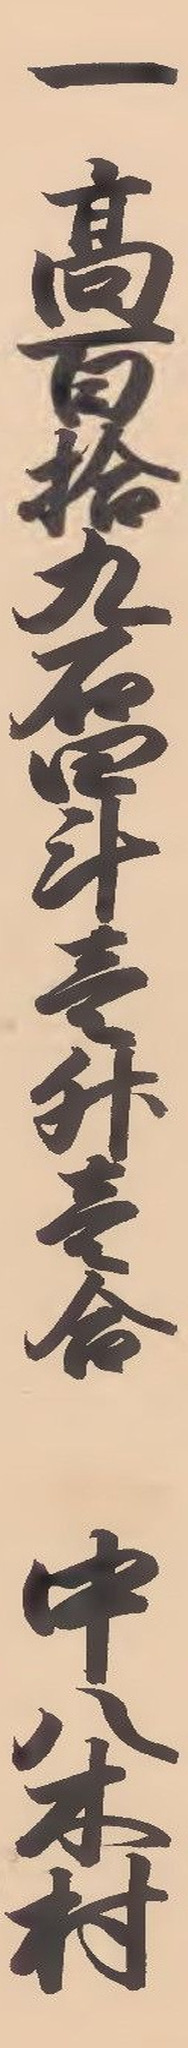一高百拾九石四斗壱升壱合中八木村
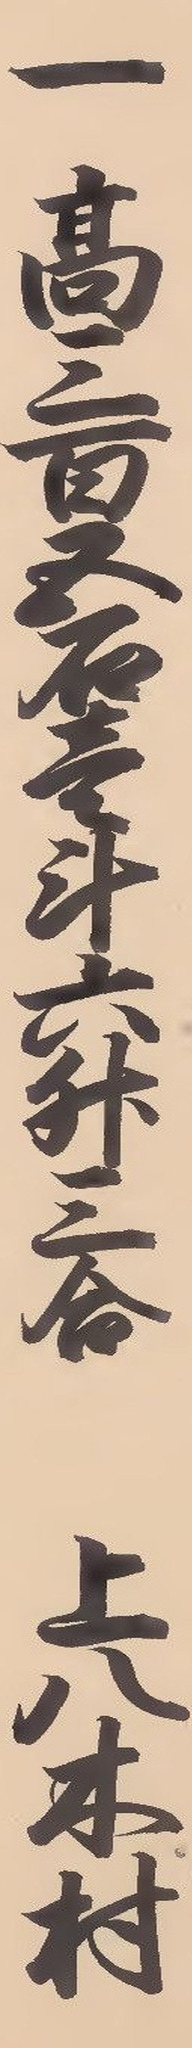一高三百五石壱斗六升三合上八木村
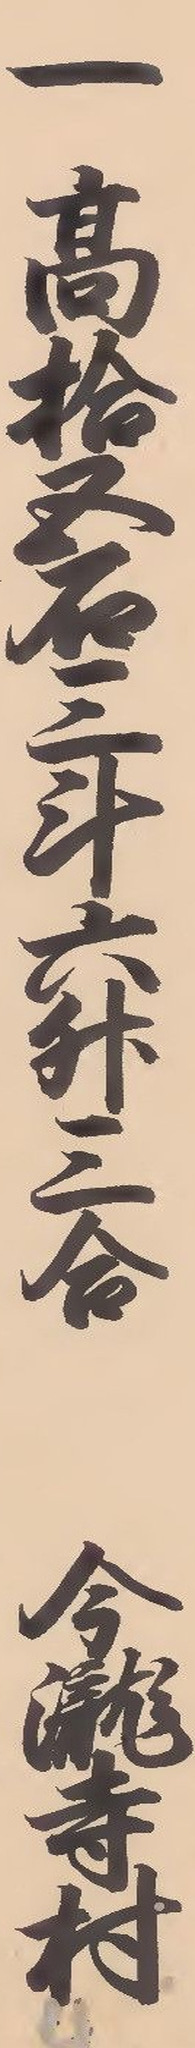一高拾五石三斗六升三合今瀧寺村
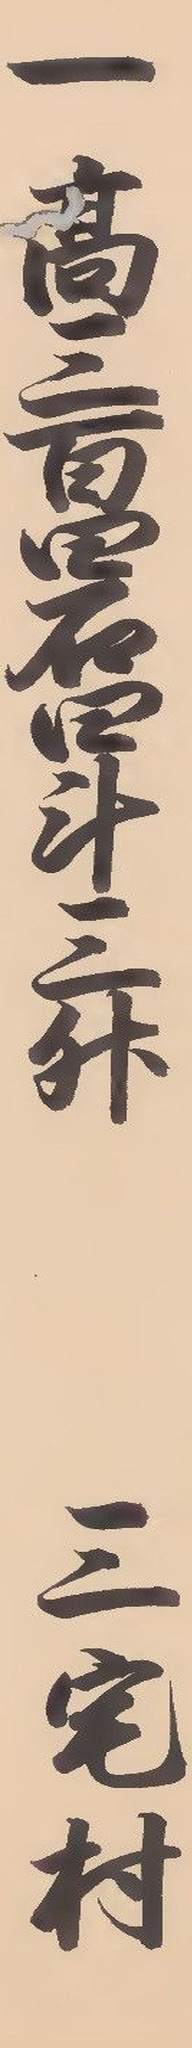一高三百四石四斗三升三宅村
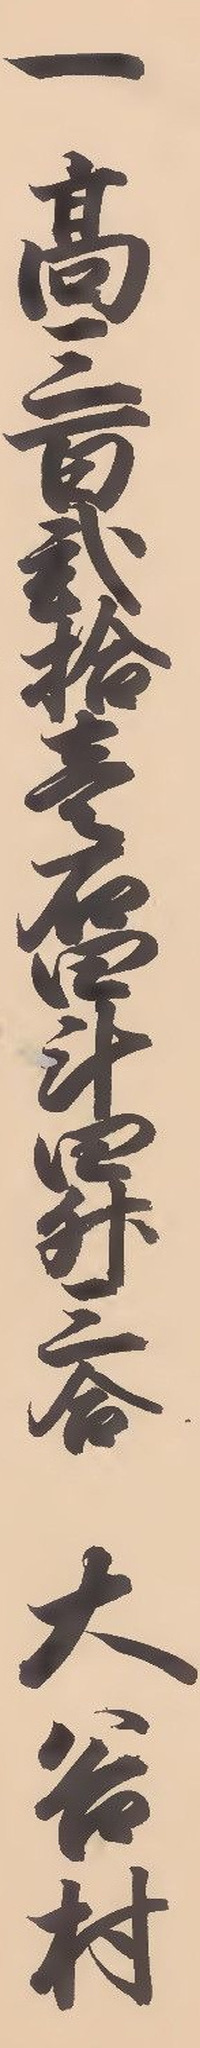一高三百弐拾壱石四斗四升三合大谷村

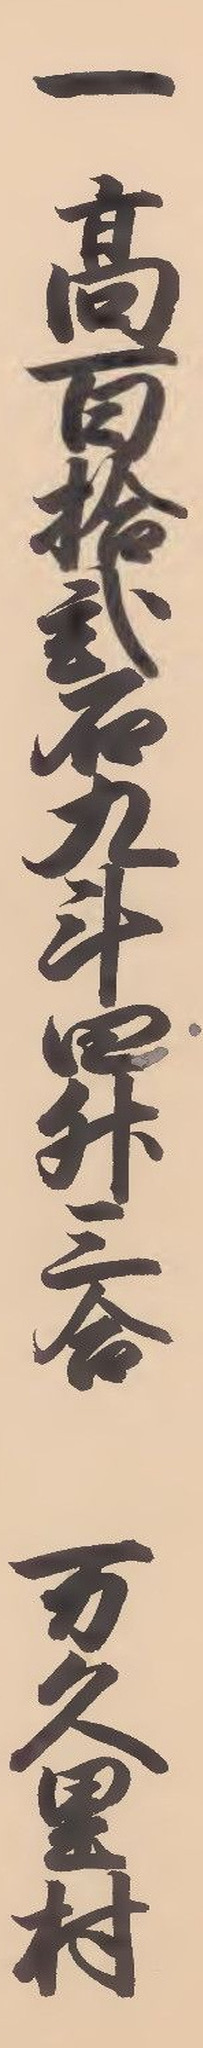一高百拾弐石九斗四升三合万久里村
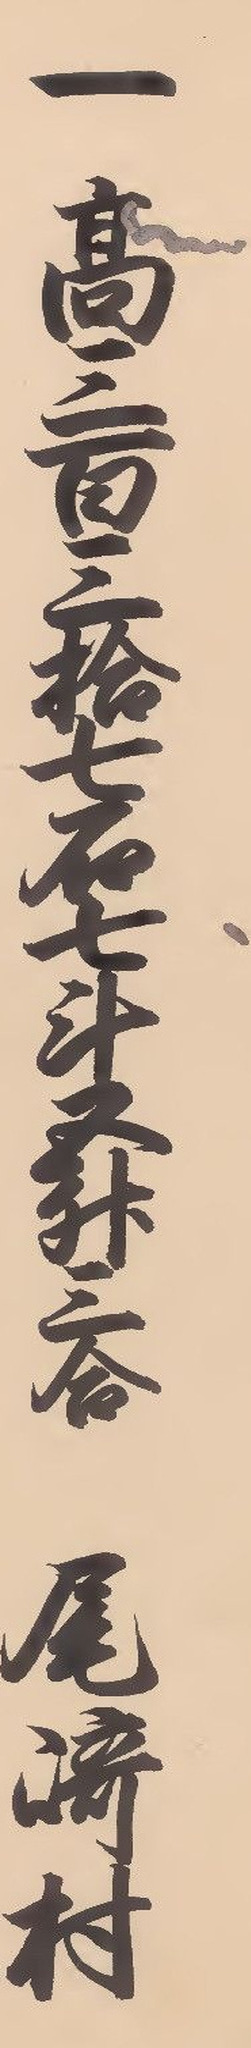一高三百三拾七石七斗五升三合尾崎村
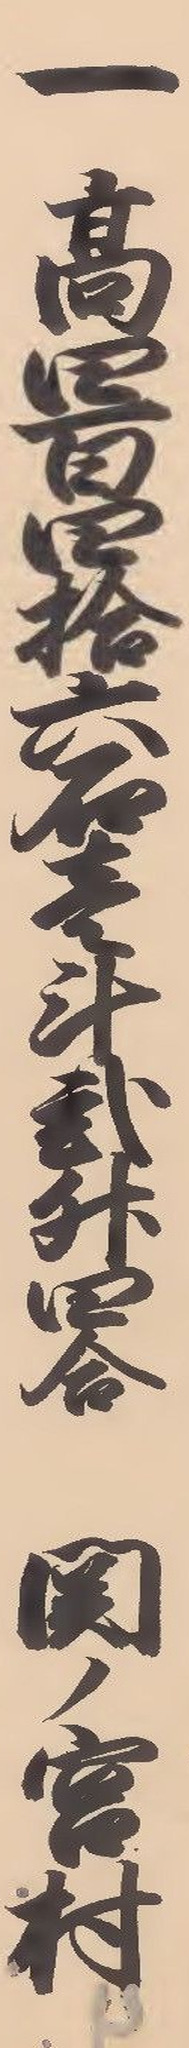一高四百四拾六石壱斗弐升四合関ノ宮村
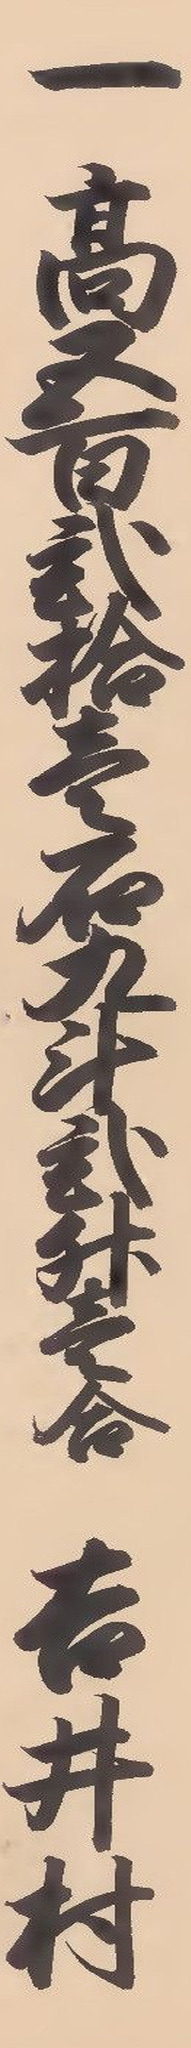一高五百弐拾壱石九斗弐升壱合吉井村
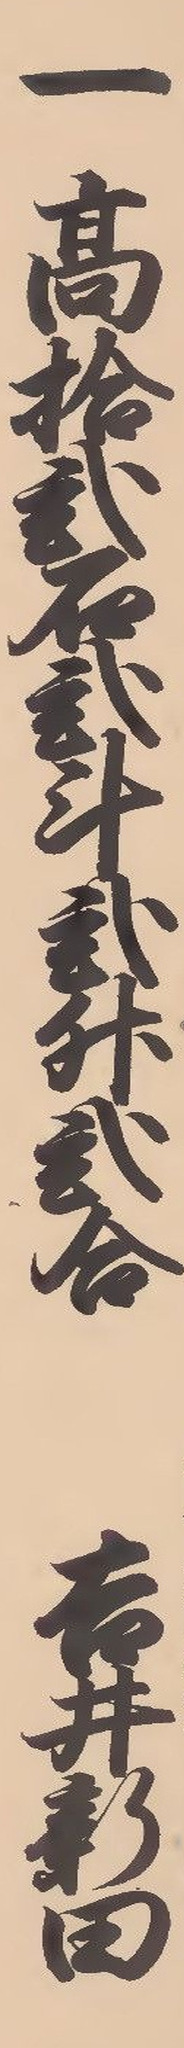一高拾弐石弐斗弐升弐合吉井新田
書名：但馬国郷帳
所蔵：国立公文書館 National Archives of Japan
